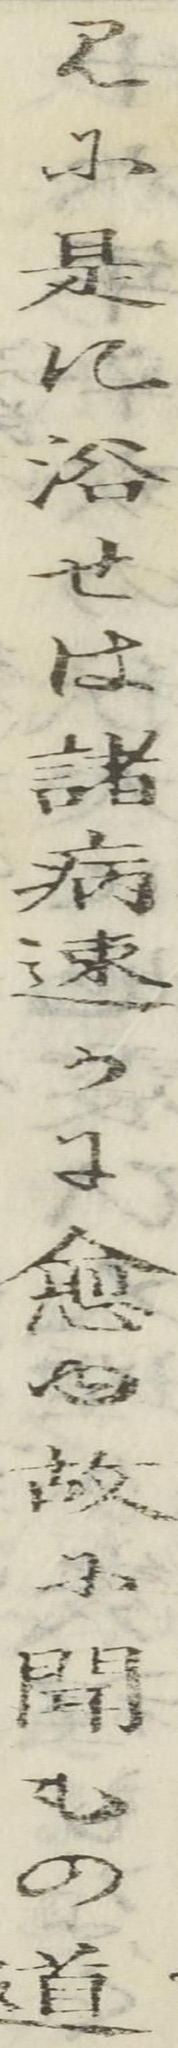みに是に浴せは諸病速かに愈ゆ故に聞もの道
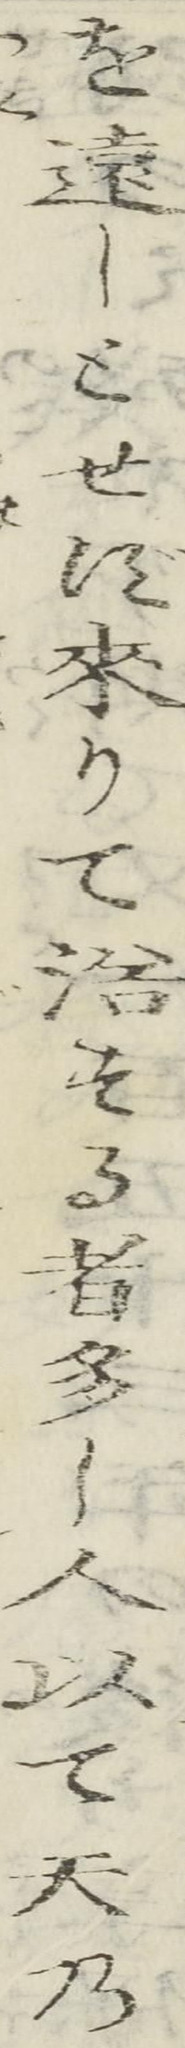を遠しとせず来りて浴する者多し人以て天の
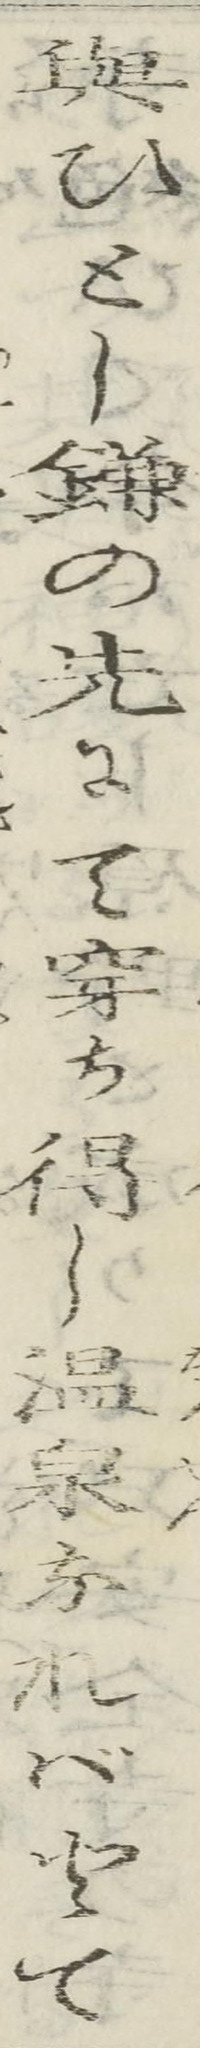与ひとし鎌の先にて穿ち得し温泉なればとて
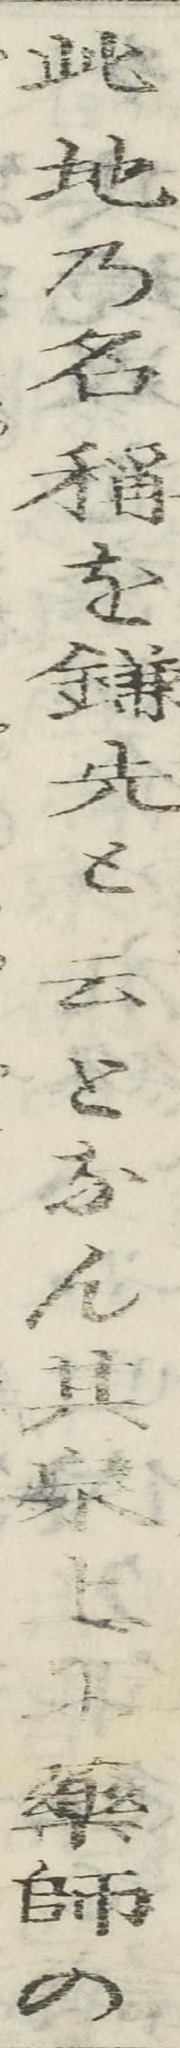此地の名称を鎌先と云となん其泉上に薬師の
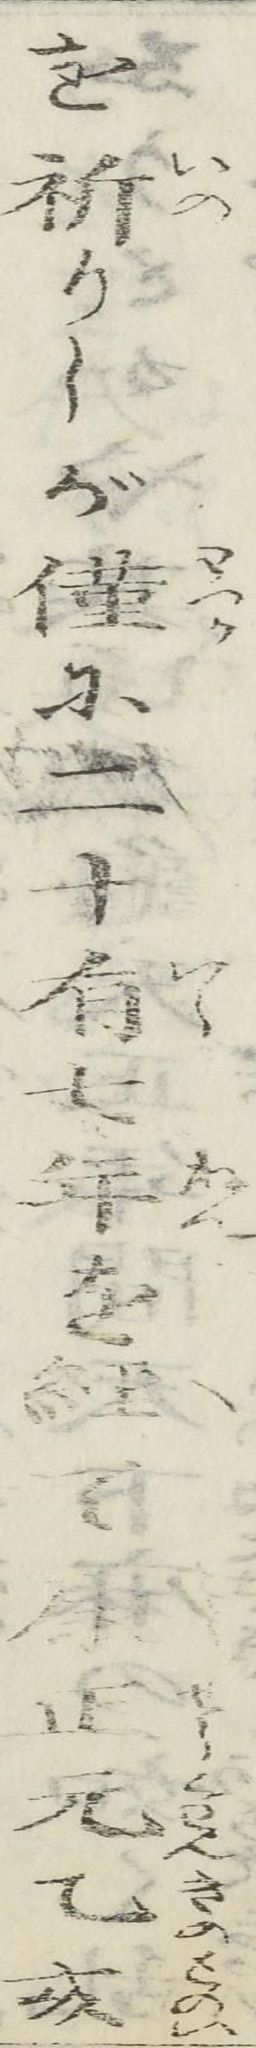を祈りしが僅に二十有七年を経て康正元乙亥
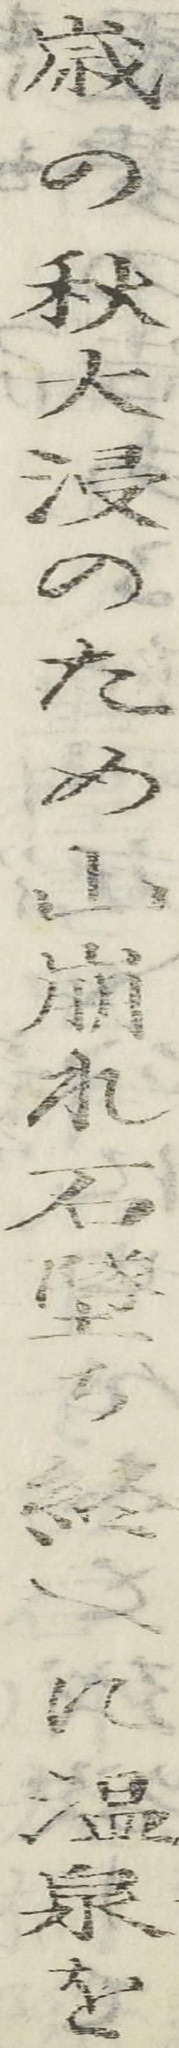歳の秋大浸のため山崩れ石墜ち終へに温泉を
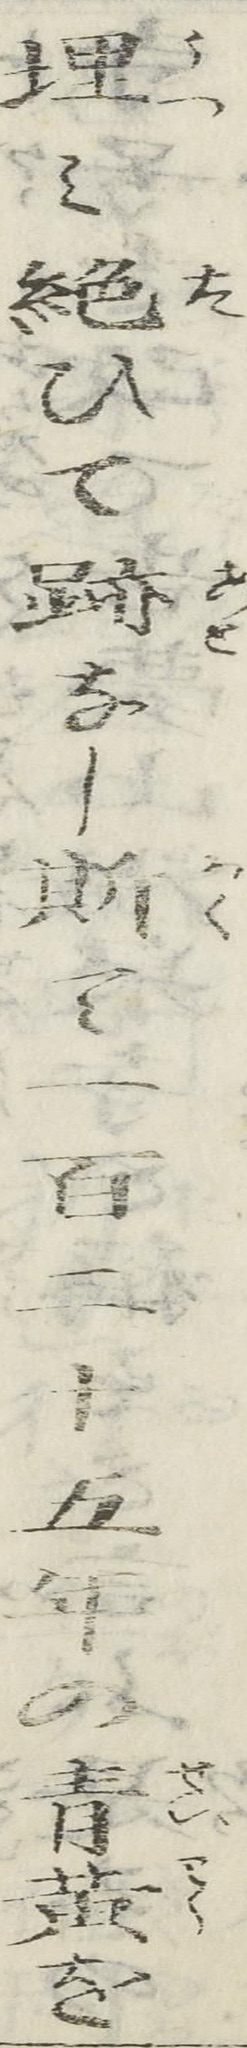埋み絶ひて跡なし斯て一百二十五年の青黄を
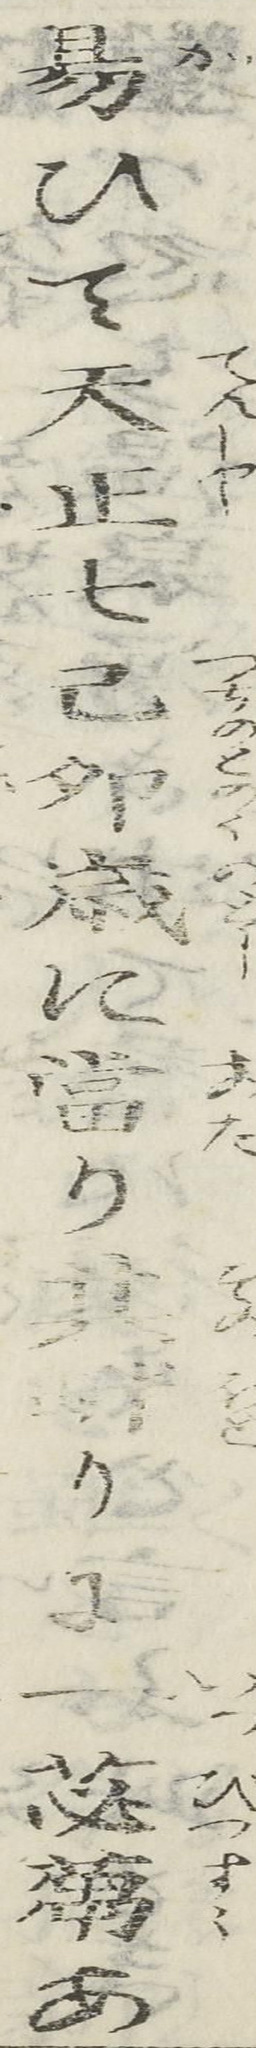易ひて天正七己卯歳に当り其畔りに一苾蒭あ
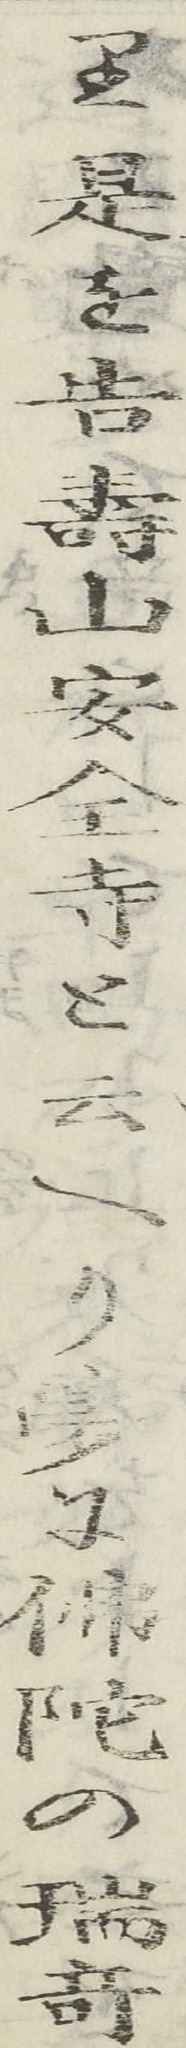り是を告寿山安全寺と云へり夢に仏陀の瑞奇

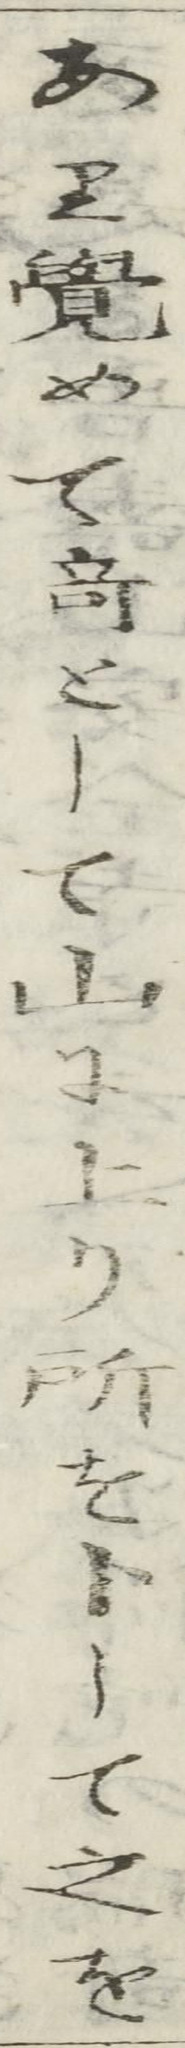あり覚めて奇として山に上り所を卜して之を
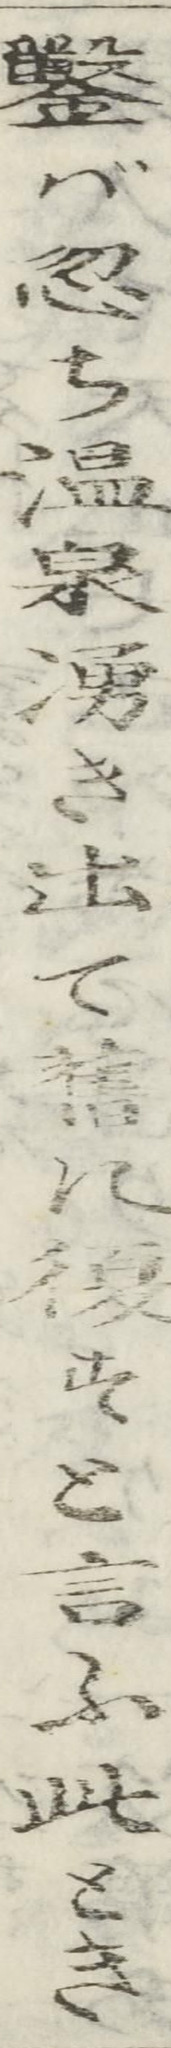鑿ば忽ち温泉湧き出て旧に復すと言ふ此とき
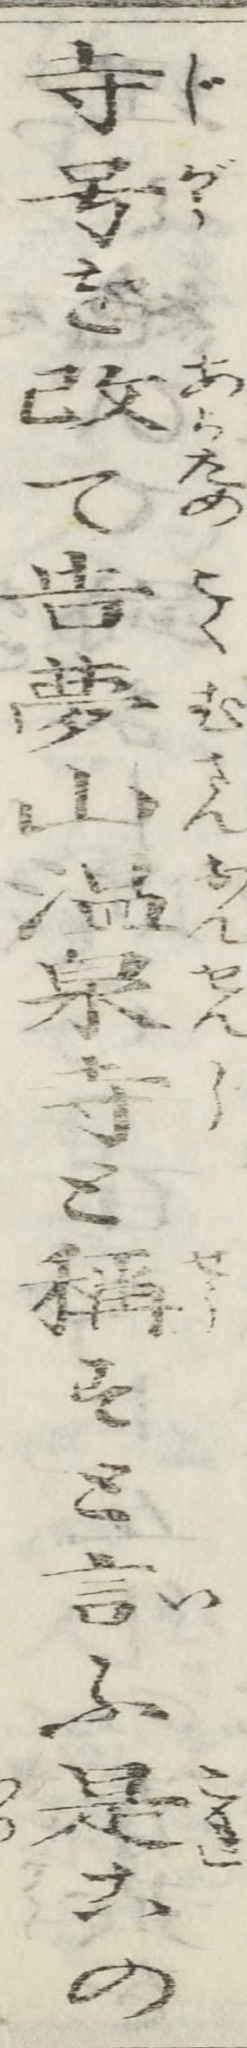寺号を改て告夢山温泉寺と称すと言ふ是この
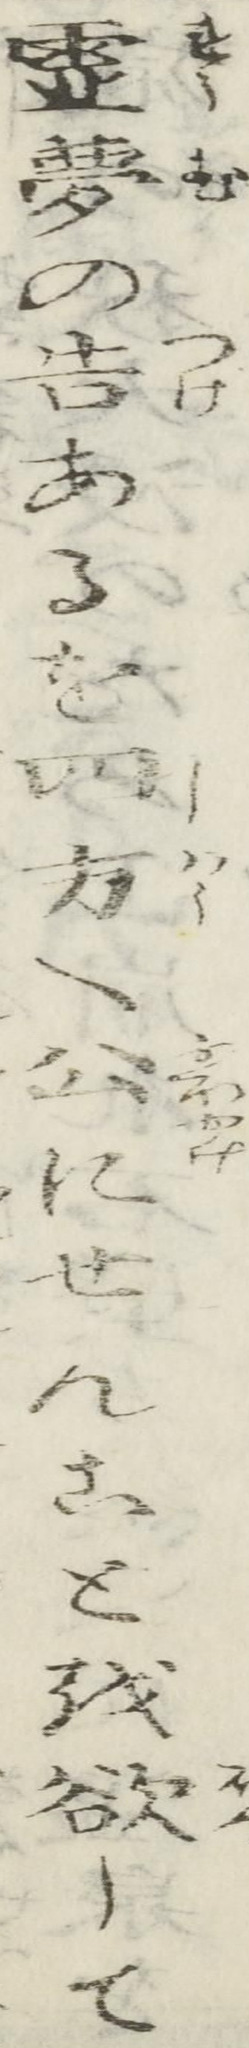霊夢の告あるを四方ゝ公にせんことを欲して
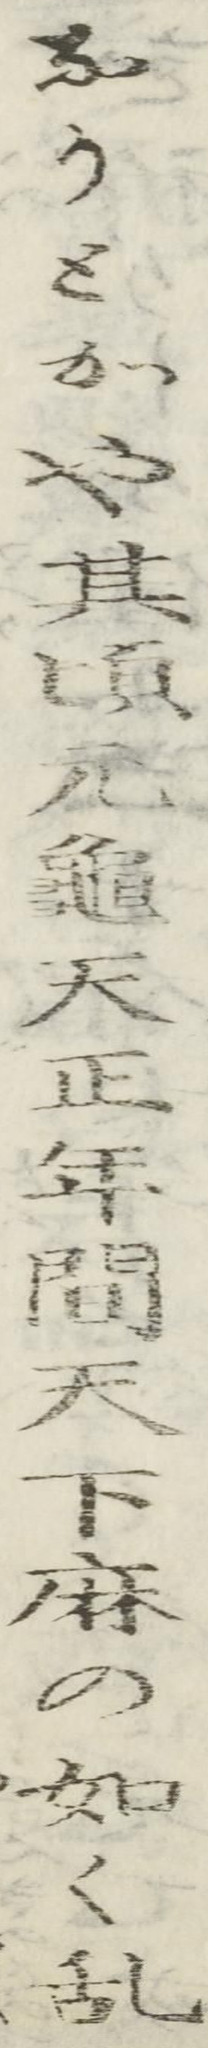なうとかや其頃元亀天正年間天下麻の如く乱
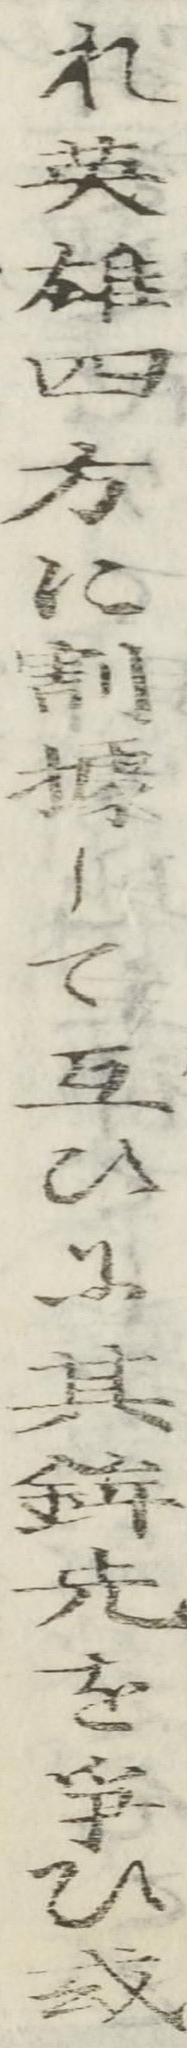れ英雄四方に割拠して互いに其鉾先を争ひ或
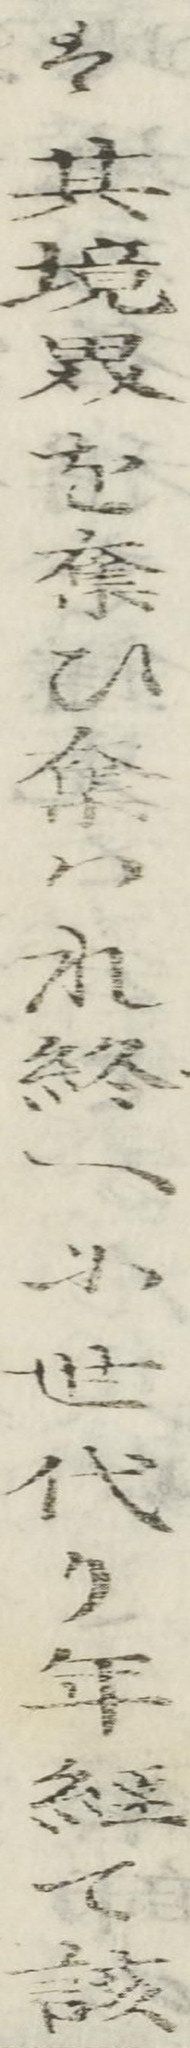は其境界を奪ひ奪はれ終いに世代り年経て該
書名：鎌先温泉由來記
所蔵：東京大学地震研究所図書室 Earthquake Research Institute Library, The University of Tokyo, JAPAN
